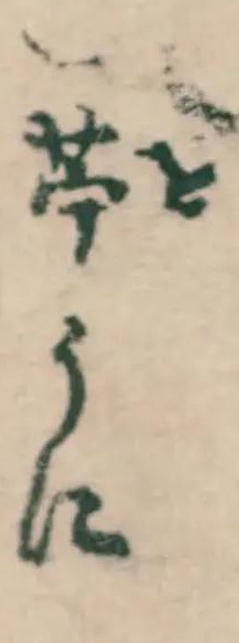○苧うに
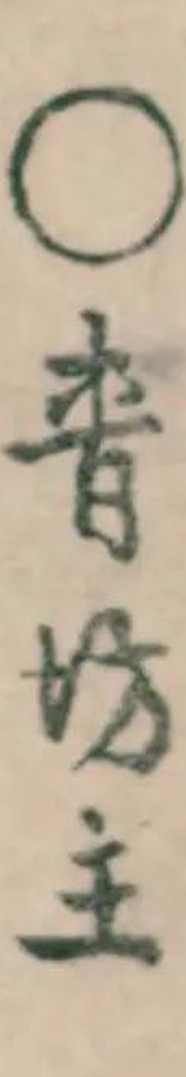○青坊主

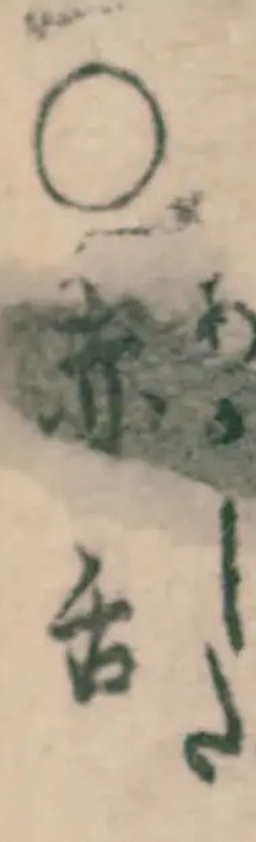○赤舌
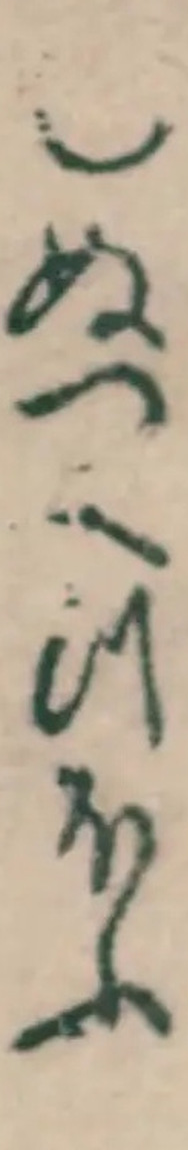○ぬつへつほふ

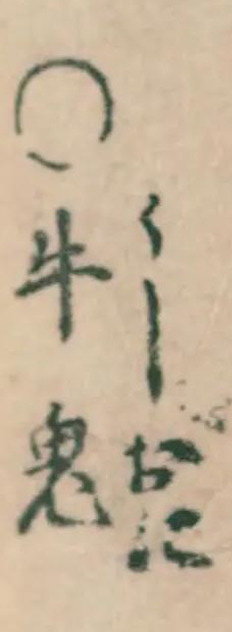○牛鬼
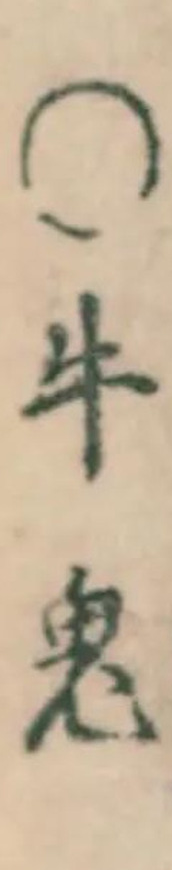○牛鬼
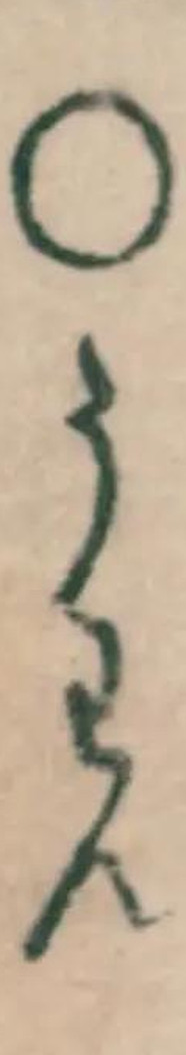○うわん

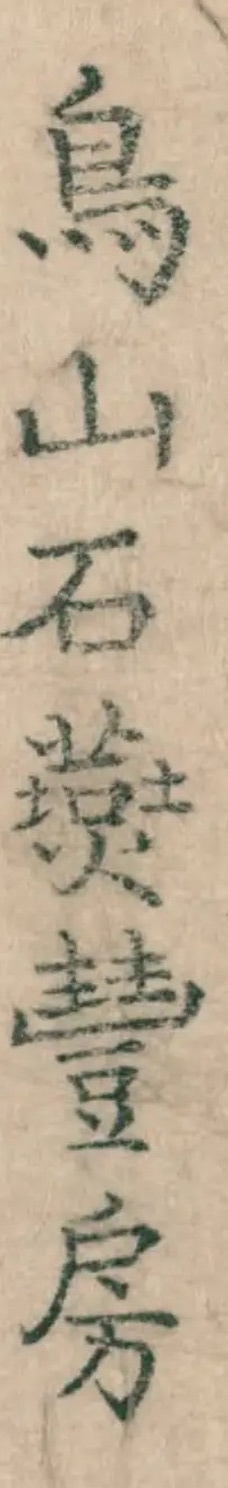鳥山石燕豊房
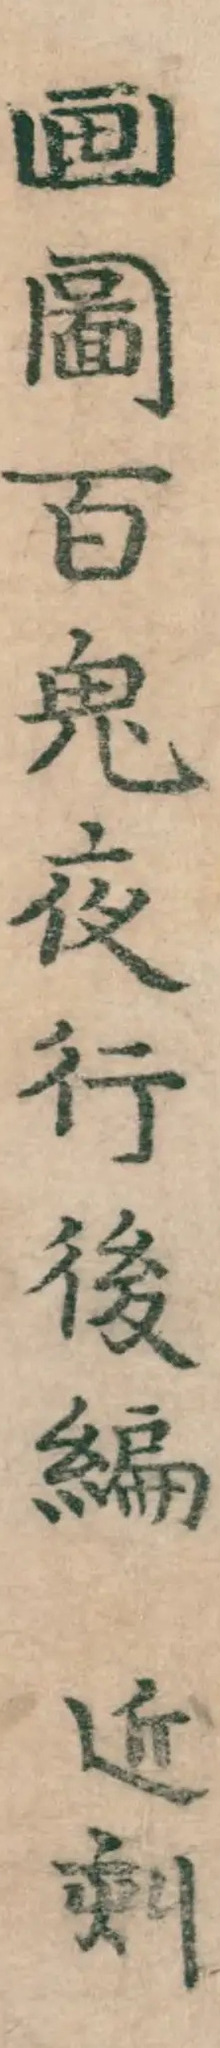画図百鬼夜行後編近刻
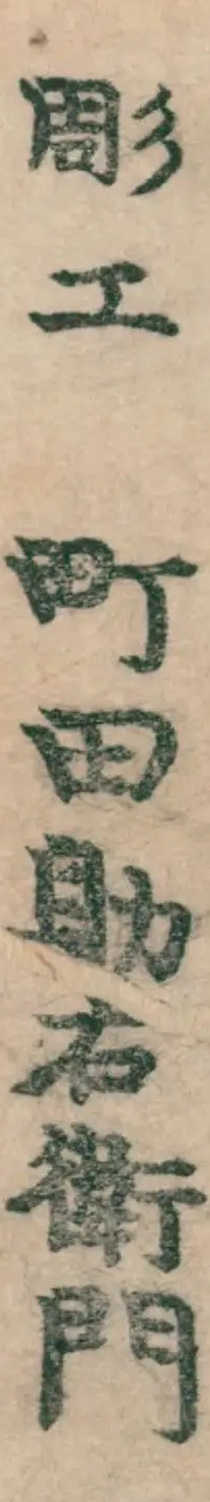彫工町田勘右衛門
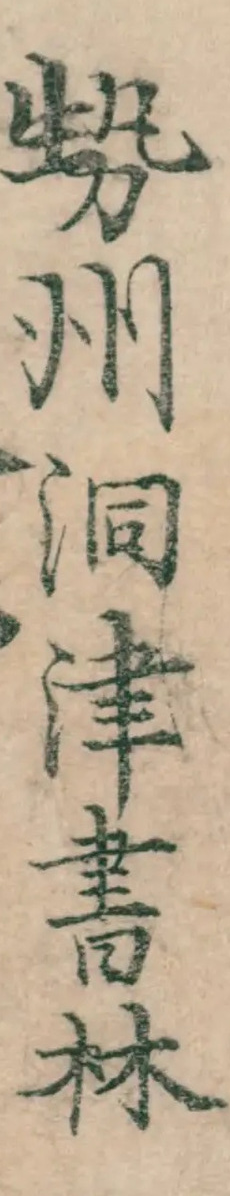勢州洞津書林
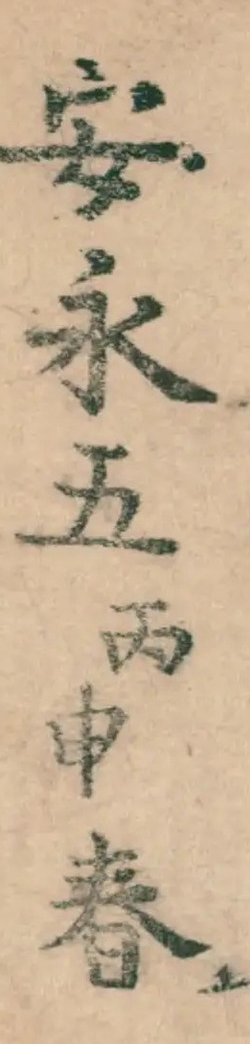安永五丙申春
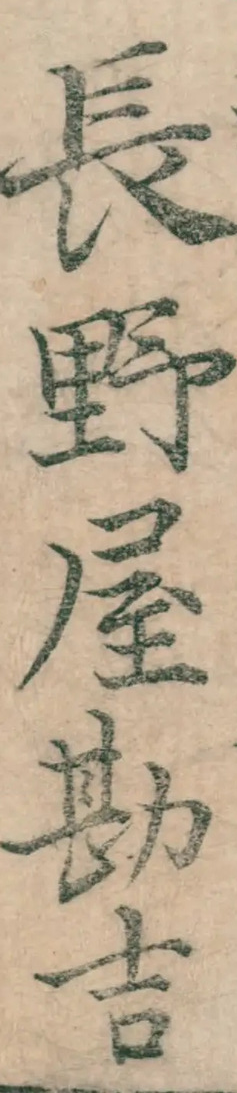長野屋勘吉
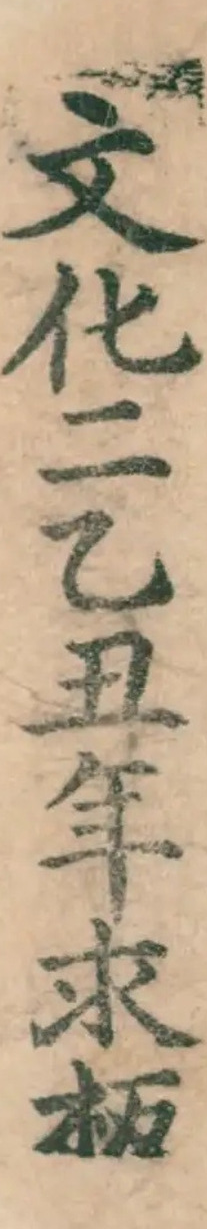文化二乙丑年求板
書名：百鬼夜行 3巻拾遺3巻. [1]
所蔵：国立国会図書館 National Diet Library, JAPAN
